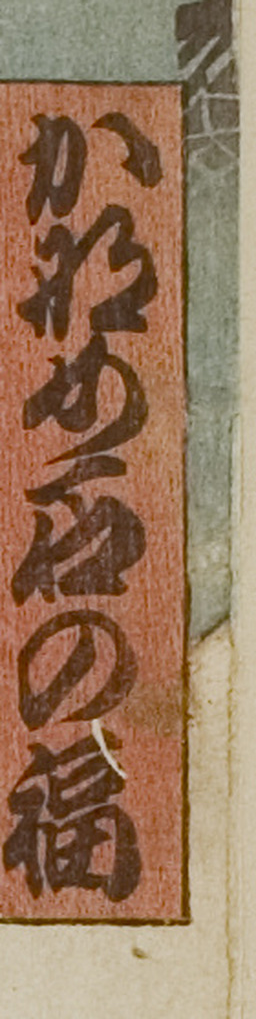かなめ石の福
